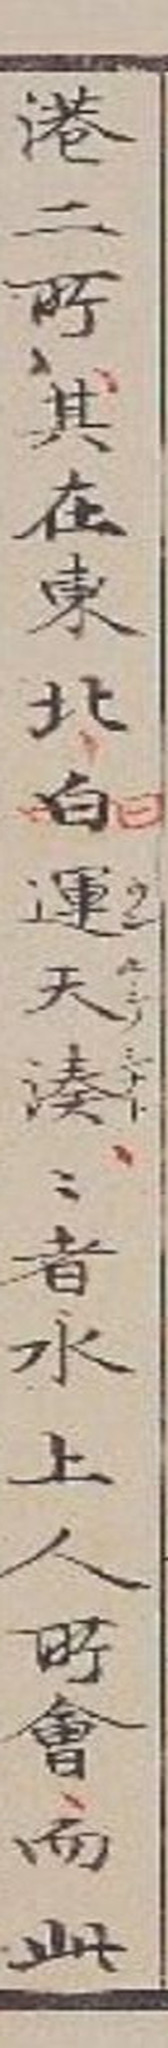港二所、其在東北、白曰運天湊、々者水上人所会、而此
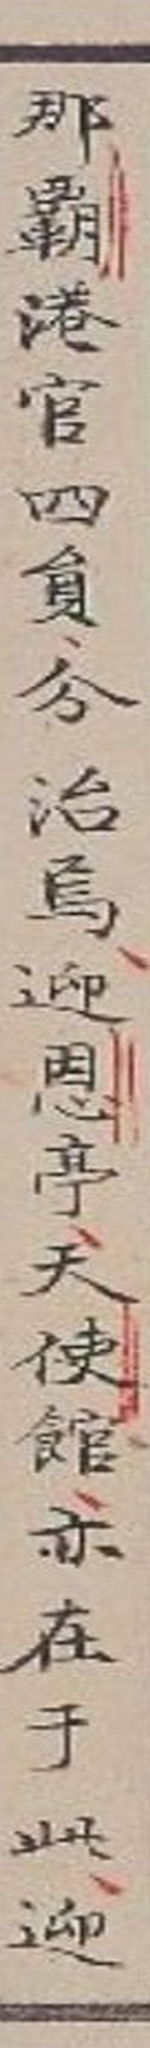那覇港官四員、分治焉、迎恩亭、天使館、亦在于此、迎

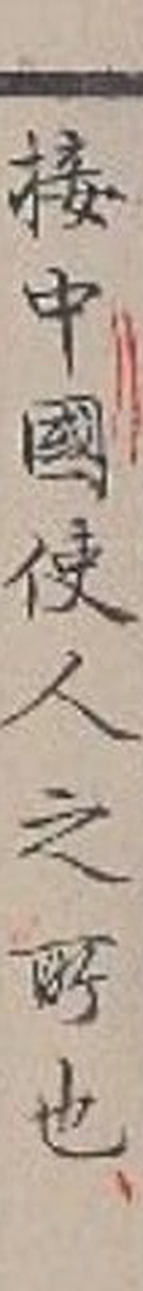接中国使人之所也、
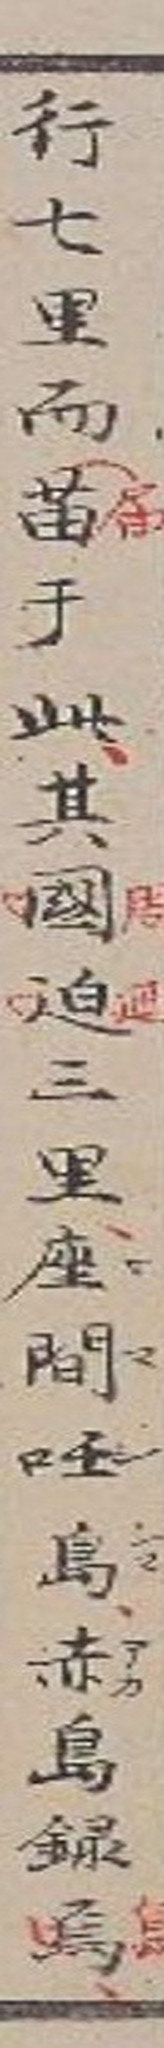行七里而苗届于此、其国迫周廻三里、座間島、赤島録焉島、
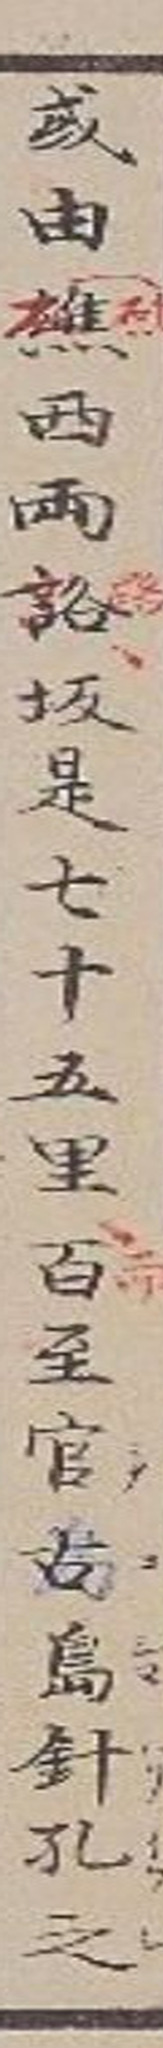或由礁西両詻路、坂是七十五里、百而至宮古島針孔之
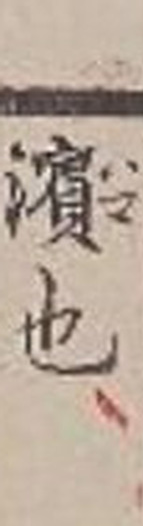浜也、
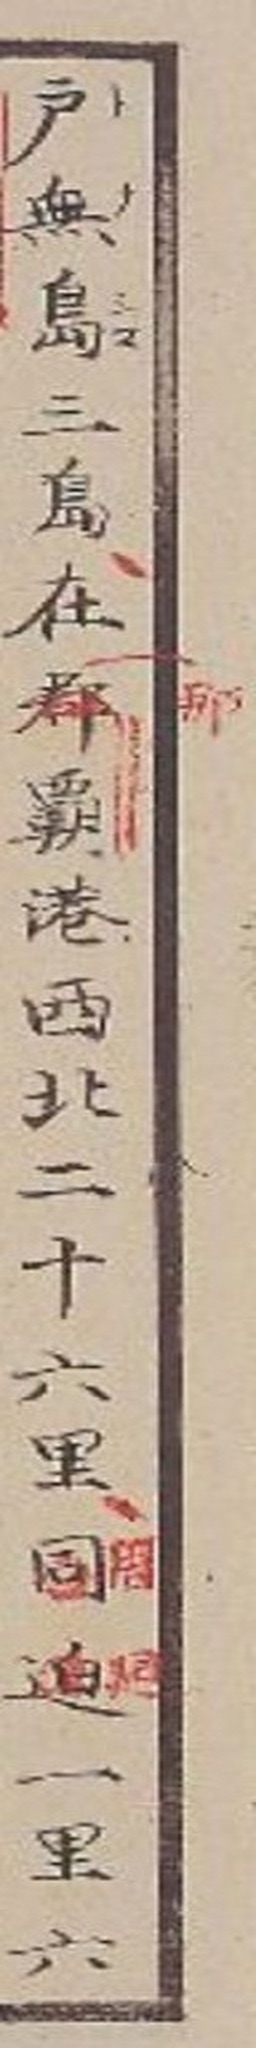戸無島三島、在郡那覇港西北二十六里、同迫周廻一里六
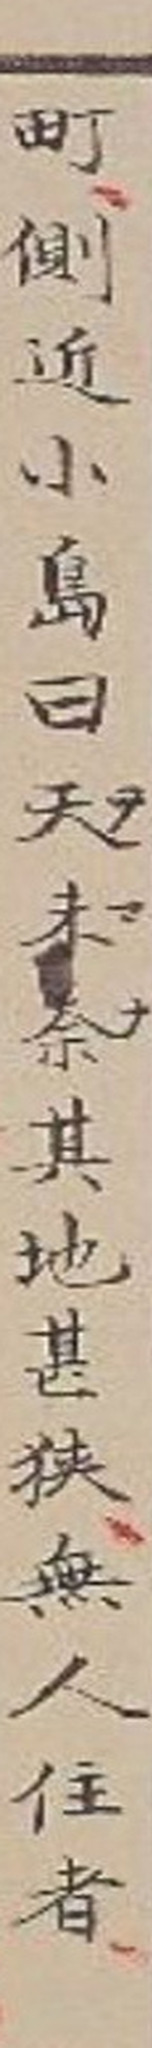町、側近小島曰天未奈其地甚狭、無人住者、
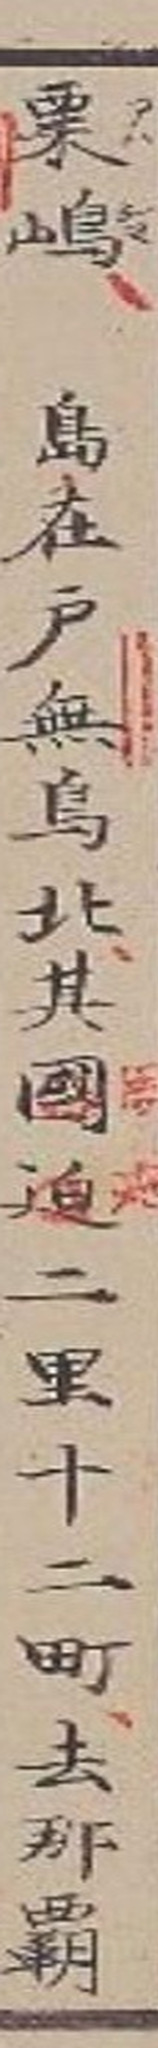粟島、島在戸無島北、其国迫周廻二里十二町、去那覇
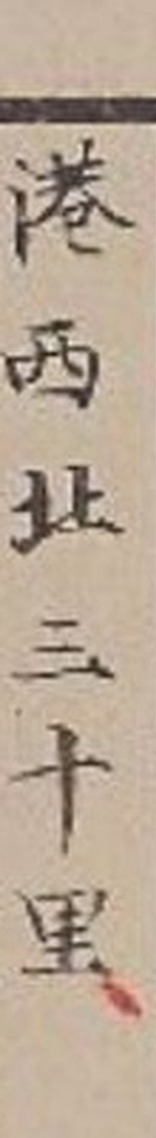港西北三十里、

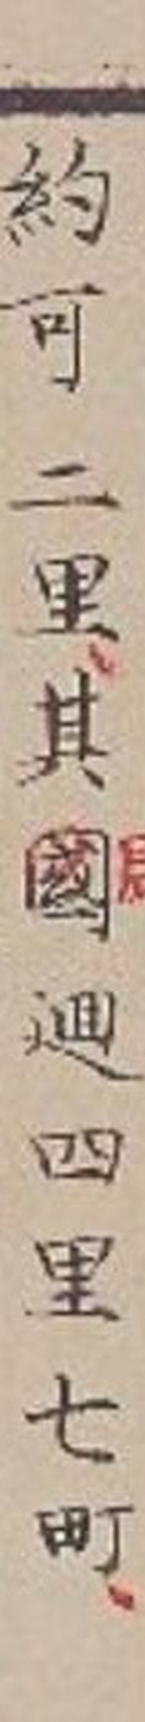約可二里、其国周廻四里七町、
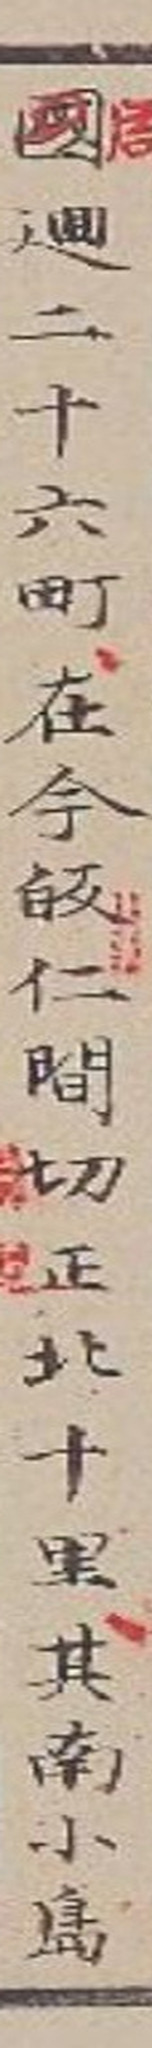国周廻二十六町、在今帰仁間切正北十里、其南小島
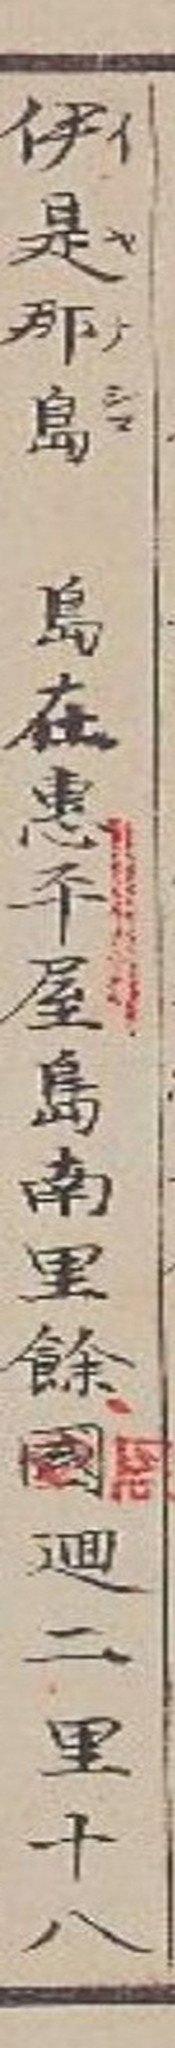伊是那島島在恵平屋島南里余、国周廻二里十八
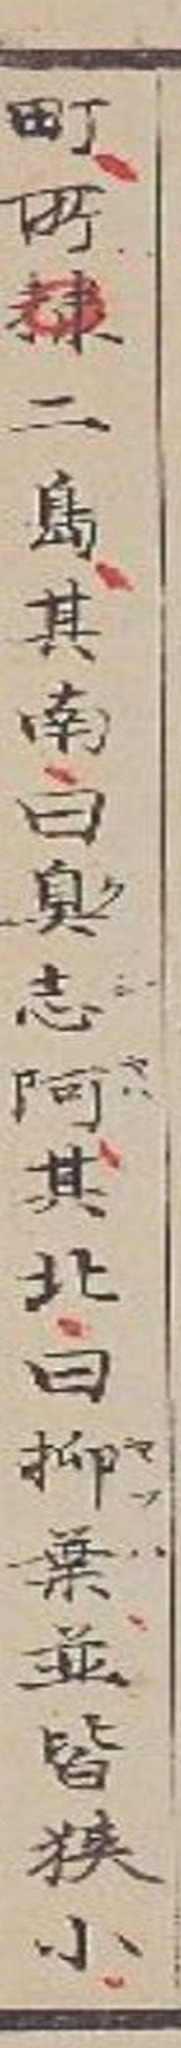町、所隷二島、其南、曰具志阿、其北、曰柳葉、並皆狭小、
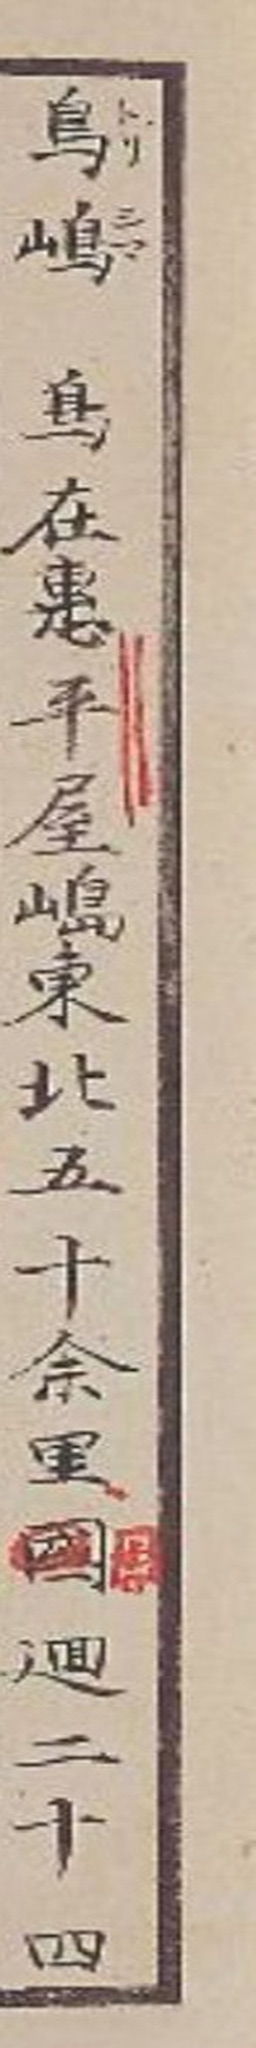鳥島島在恵平屋島東北五十余里、國周廻二十四
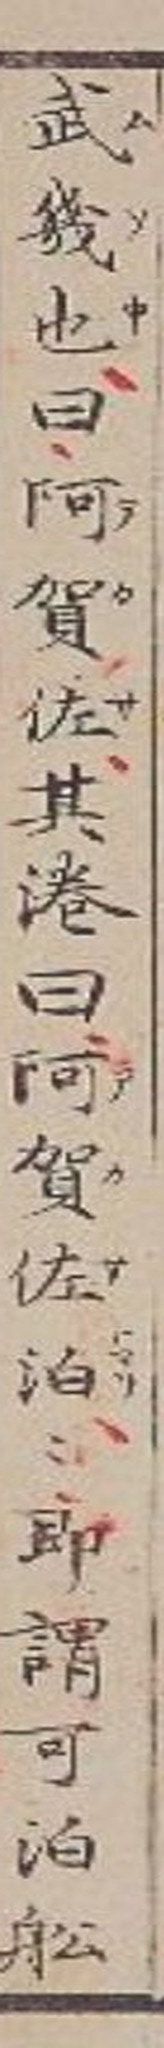武幾也、曰、阿賀佐、其港曰阿賀佐泊、々即謂可泊船
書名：南島志 全
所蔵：University of the Ryukyus Library
